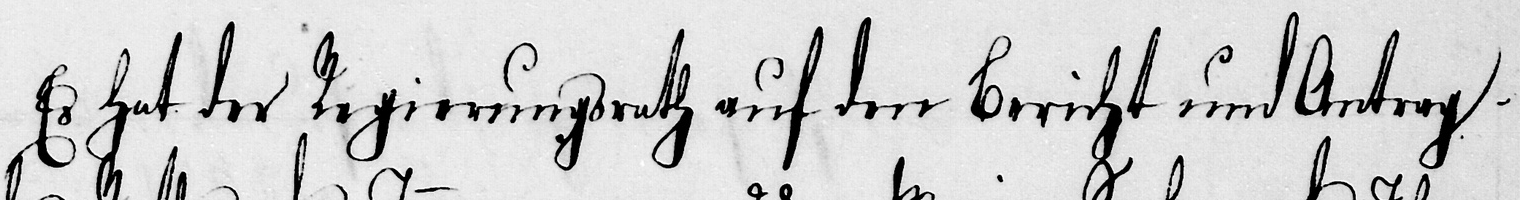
Es hat der Regierungsrath auf den Bericht und Antrag
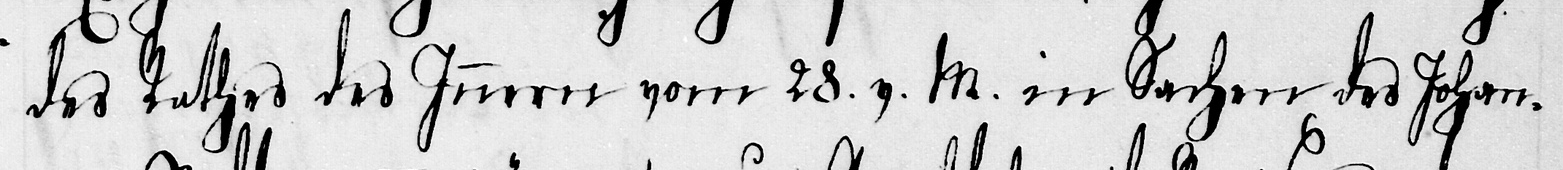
des Rathes des Innern vom 28. v. M. in Sachen des Johan¬
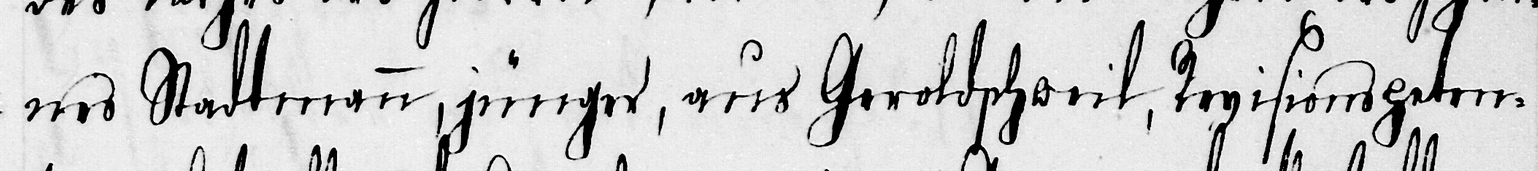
nes Stadtmann, jünger, aus Geroldschweil, Revisionspeten¬
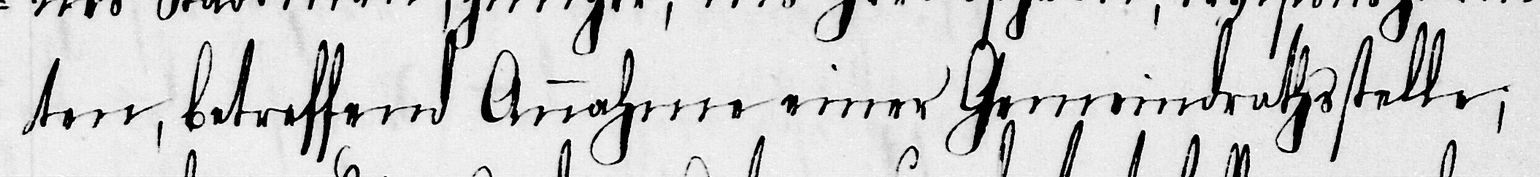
ten, betreffend Annahme einer Gemeindrathsstelle,
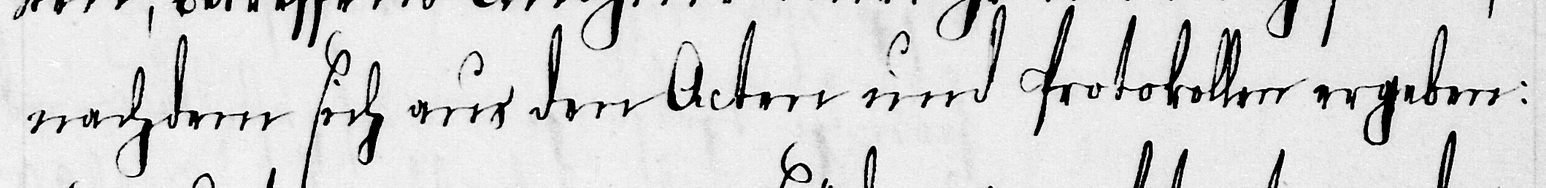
nachdem sich aus den Acten und Protokollen ergeben:
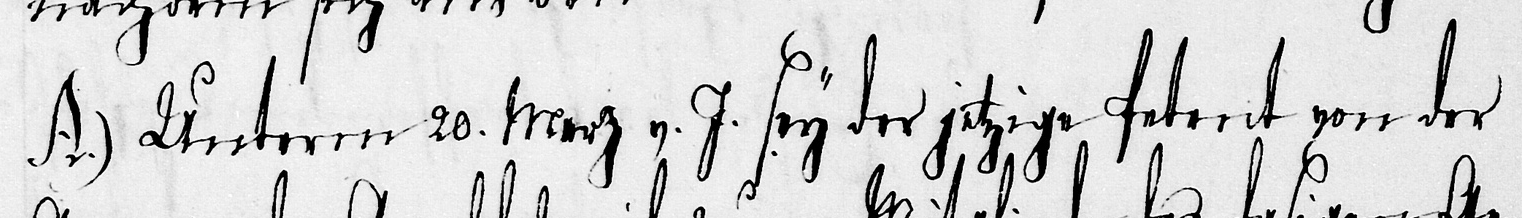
A.) Unterm 20. Merz v. J. sey der jetzige Petent von der
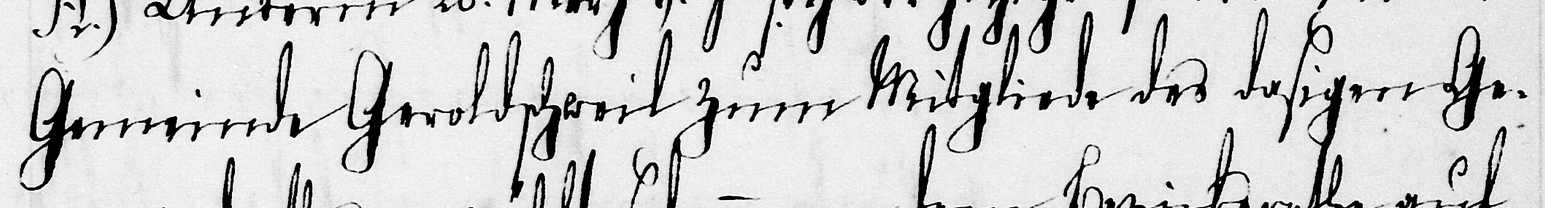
Gemeinde Geroldschweil zum Mitgliede des dasigen Ge¬
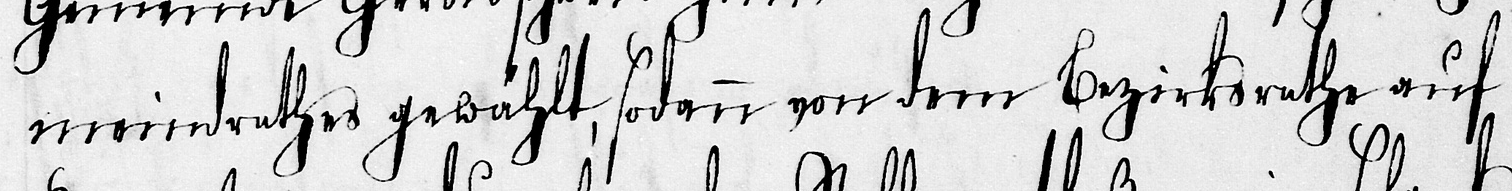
meindrathes gewählt, sodann von dem Bezirksrathe auf
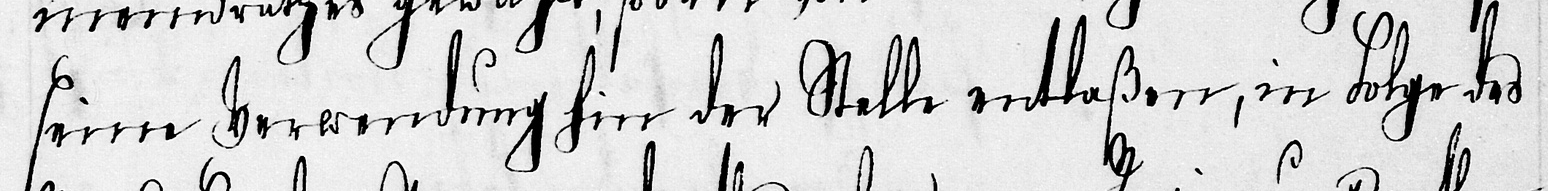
seine Verwendung hin der Stelle entlaßen, in Folge des
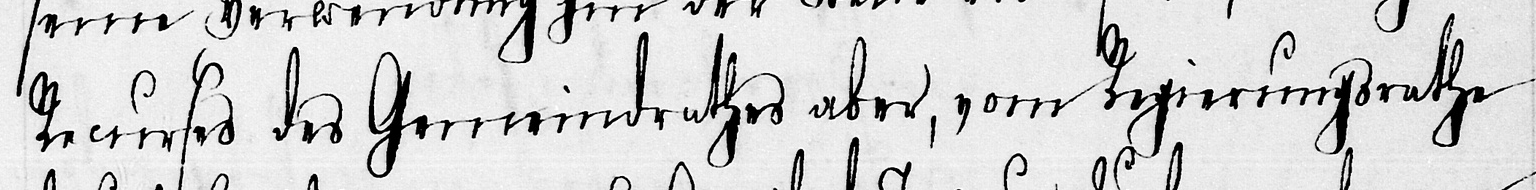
Recurses des Gemeindrathes aber, vom Regierungsrathe
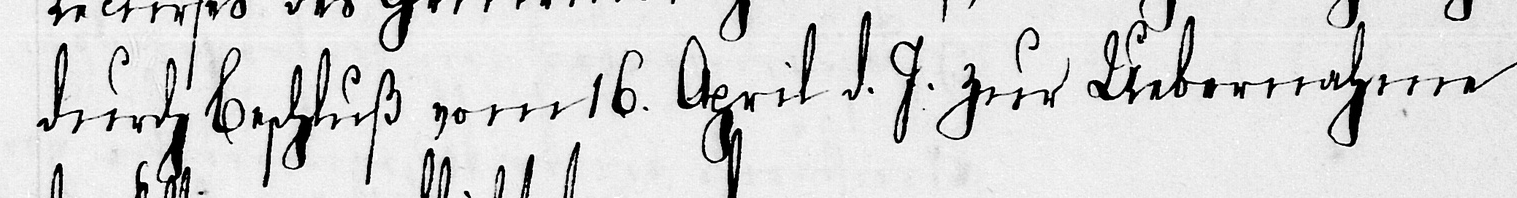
durch Beschluß vom 16. April d. J. zur Uebernahme
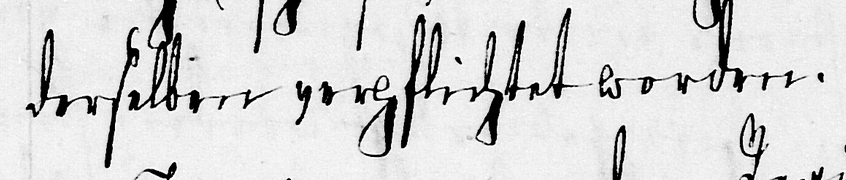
derselben verpflichtet worden.
